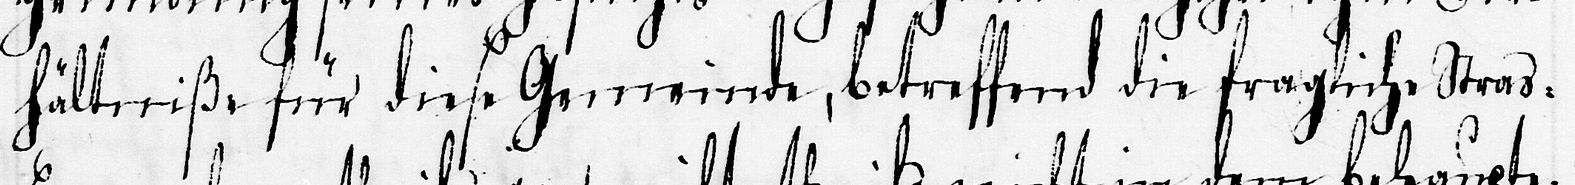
hältniße für diese Gemeinde, betreffend die fragliche Stra¬
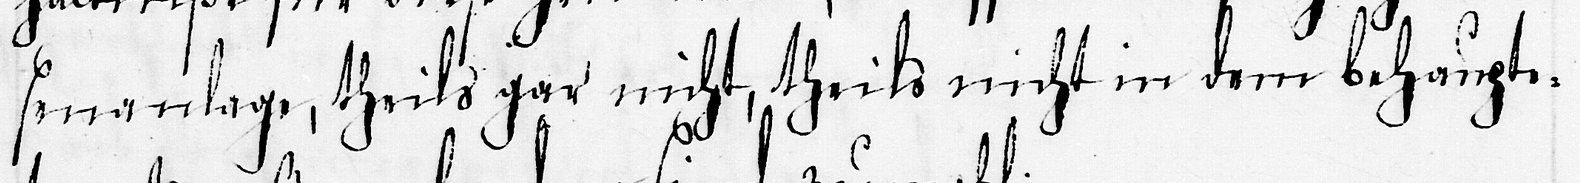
ßenanlage, theils gar nicht, theils nicht in dem behaupte¬
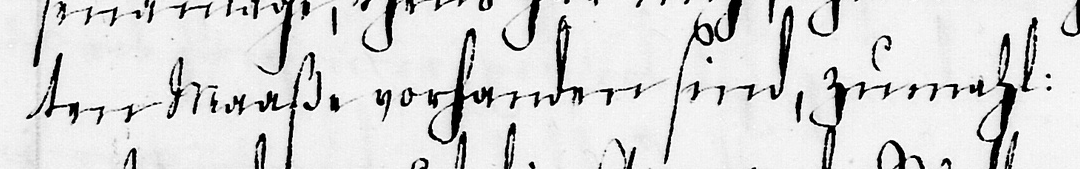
ten Maaße vorhanden sind, zumahl:
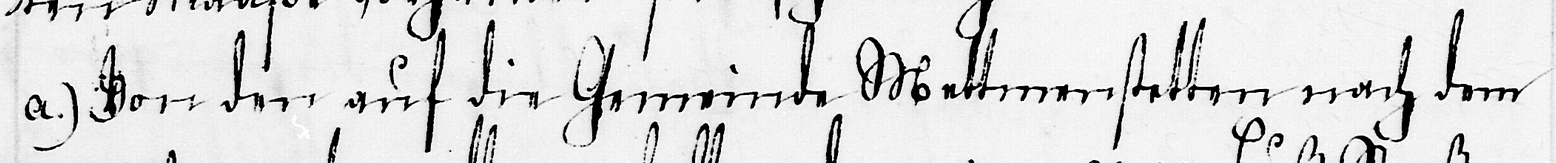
a.) Von den auf die Gemeinde Mettmenstetten nach dem
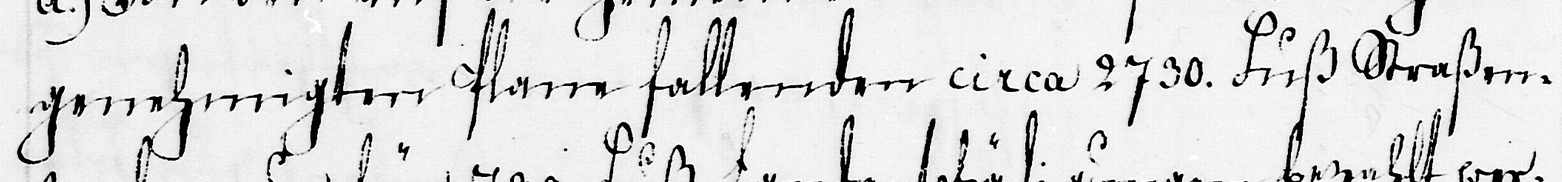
genehmigten Plane fallenden circa 2730. Fuß Straßen¬
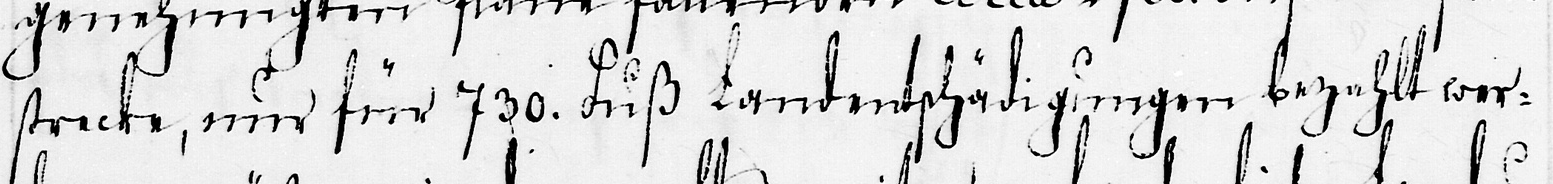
strecke, nur für 730. Fuß Landentschädigungen bezahlt wer¬
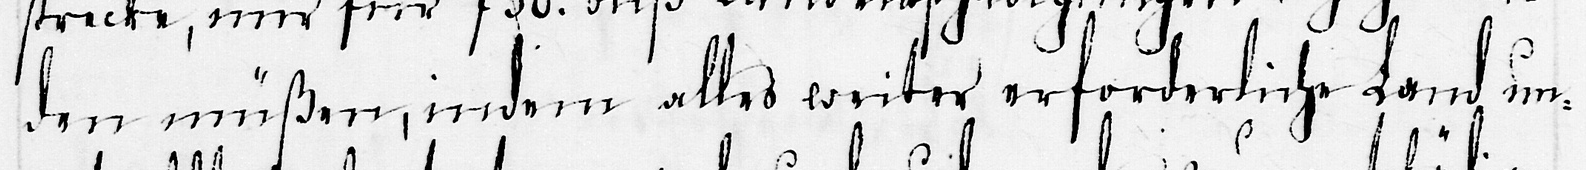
den müßen, indem alles weiter erforderliche Land un¬
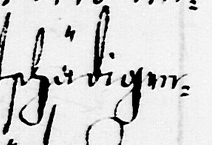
hädigen¬
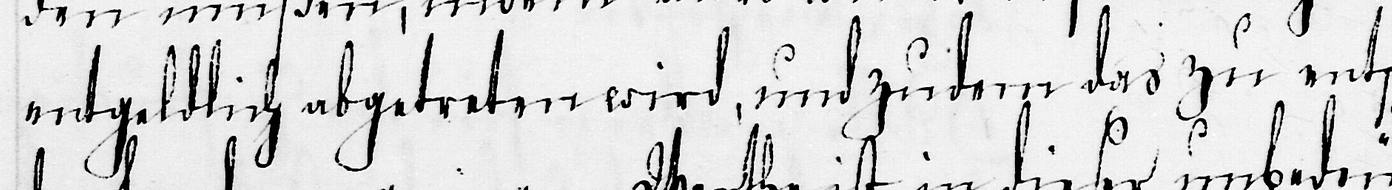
entgeldlich abgetreten wird, und zudem das zu en¬
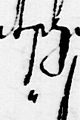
tsc¬
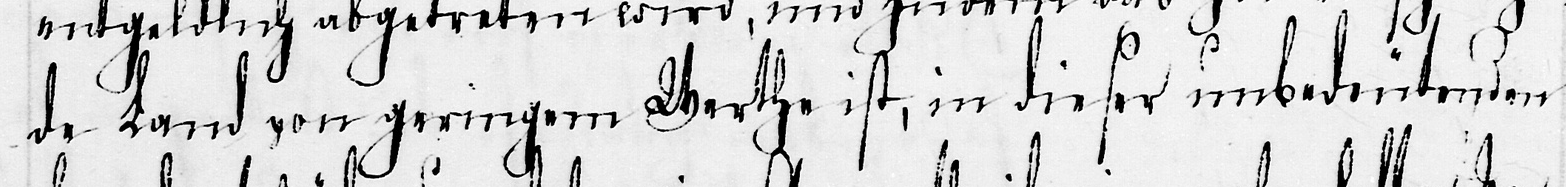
de Land von geringem Werthe ist, in dieser unbedeutenden
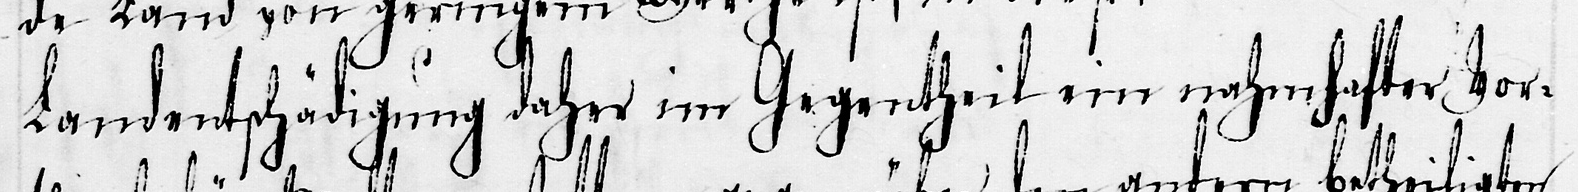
Landentschädigung daher im Gegentheil ein nahmhafter Vor¬
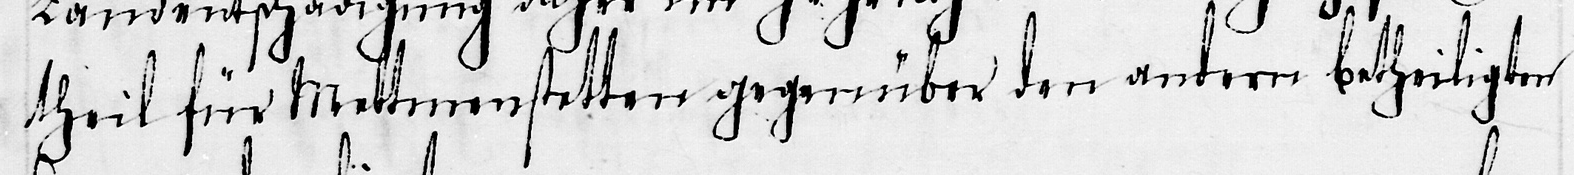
theil für Mettmenstetten gegenüber den andern betheiligten
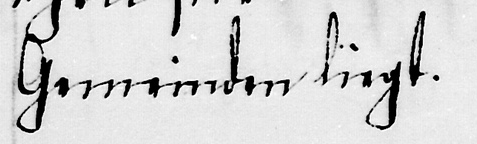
Gemeinden liegt.
